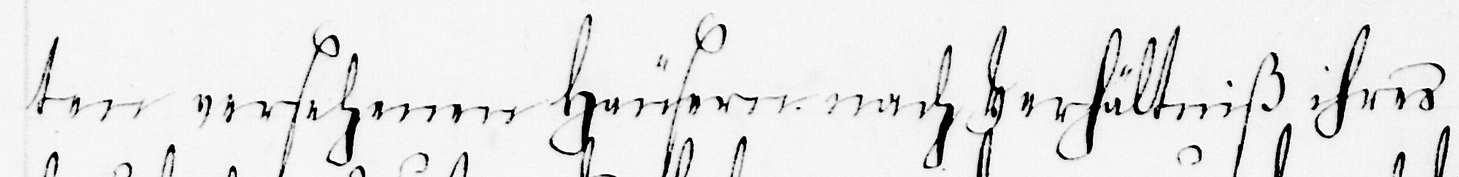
ten versehenen Häusern nach Verhältniß ihres
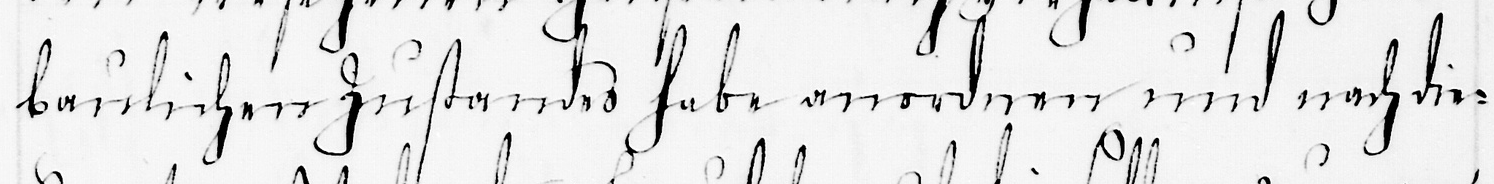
baulichen Zustandes habe anordnen und nach die¬
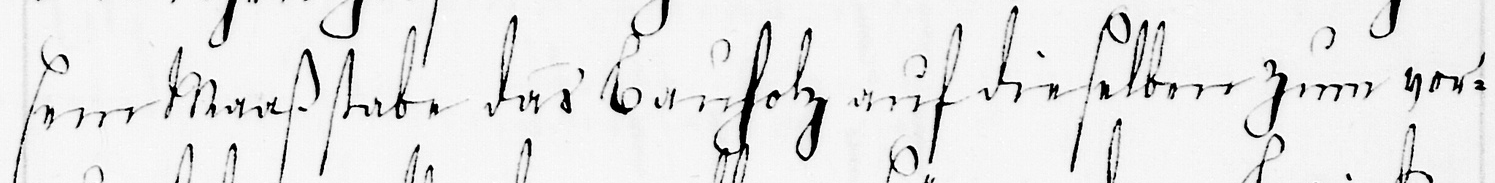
sem Maaßstabe habe das Bauholz auf dieselben zum vor¬
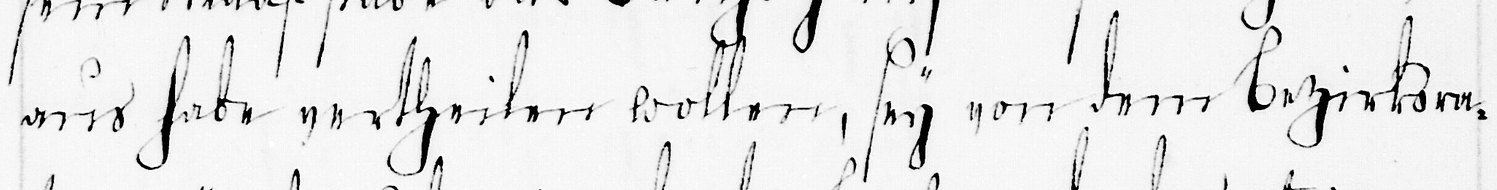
aus habe vertheilen wollen, sey von dem Bezirksra¬
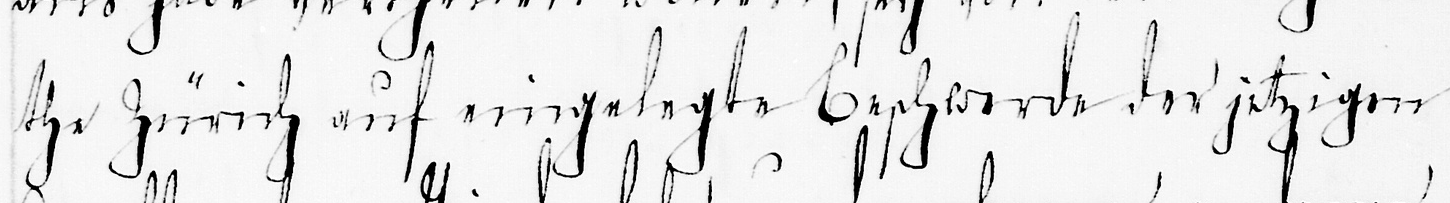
the Zürich auf eingelegte Beschwerde der jetzigen
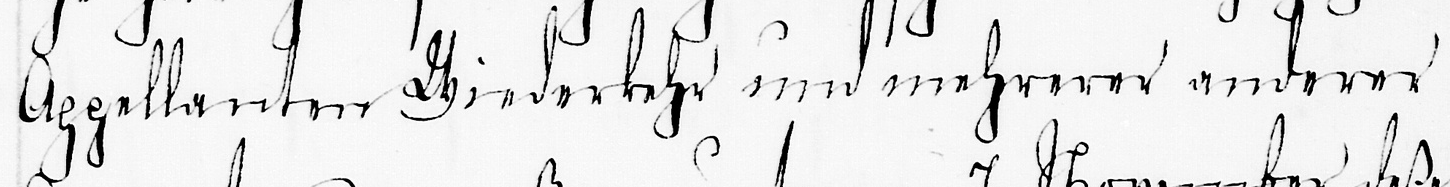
Appellanten Wiederkehr und mehrerer anderer
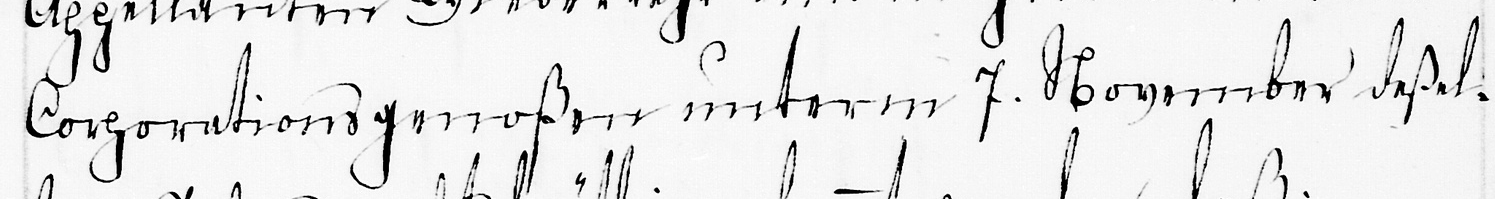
Corporationsgenoßen unterm 7. November deßel¬
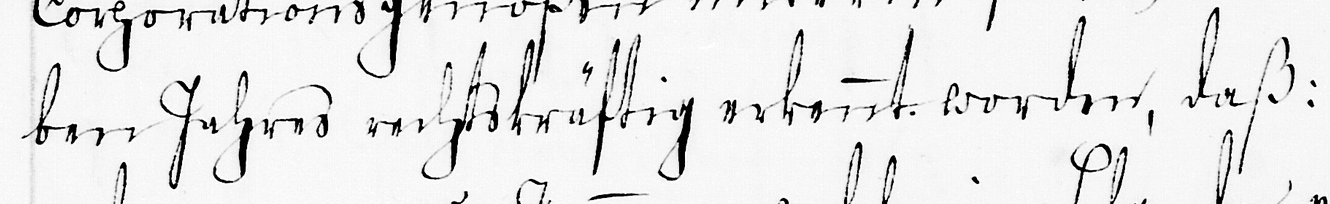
ben Jahres rechtskräftig erkennt worden, daß:
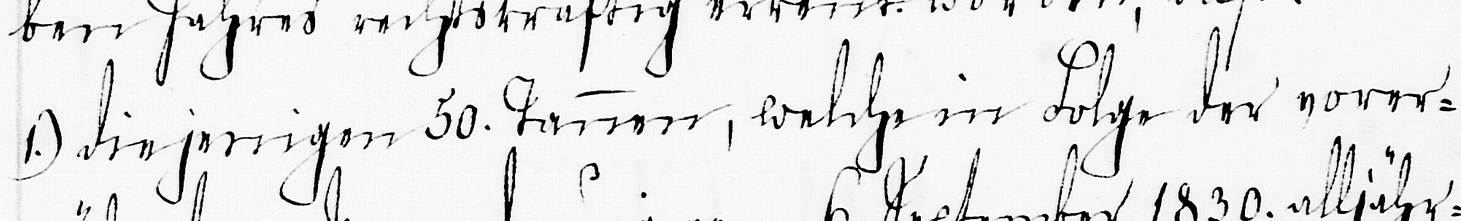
1.) diejenigen 50. Tannen, welche in Folge der vorer¬
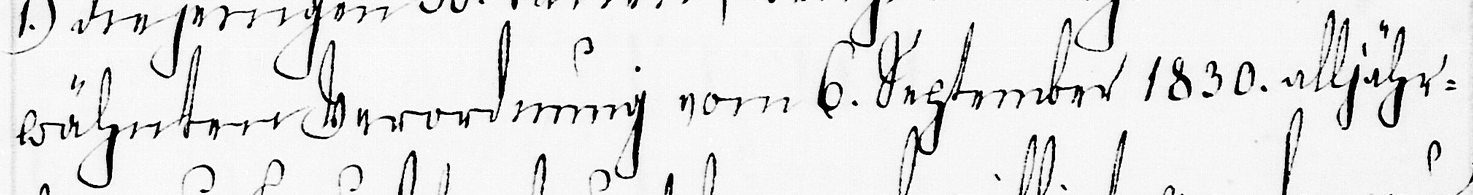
wähnten Verordnung vom 6. September 1830. alljähr¬
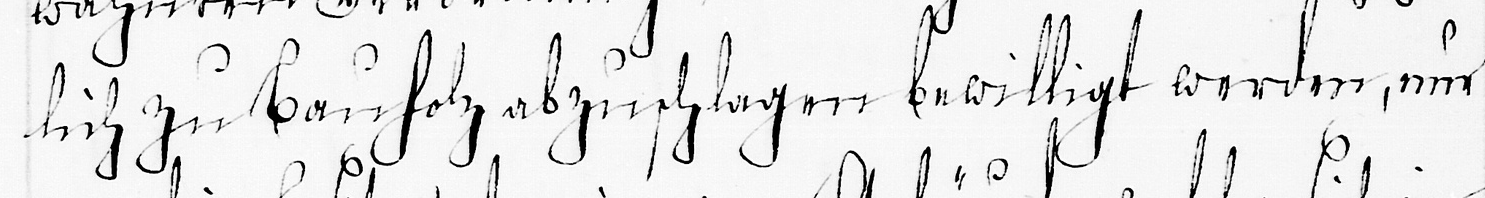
lich zu Bauholz abzuschlagen bewilligt werden, nur
